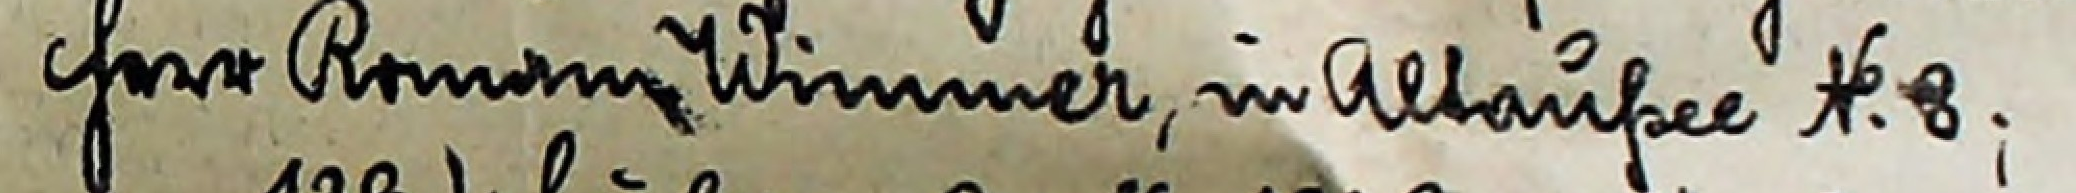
Herr Roman Wimmer, in Altaussee № 8;
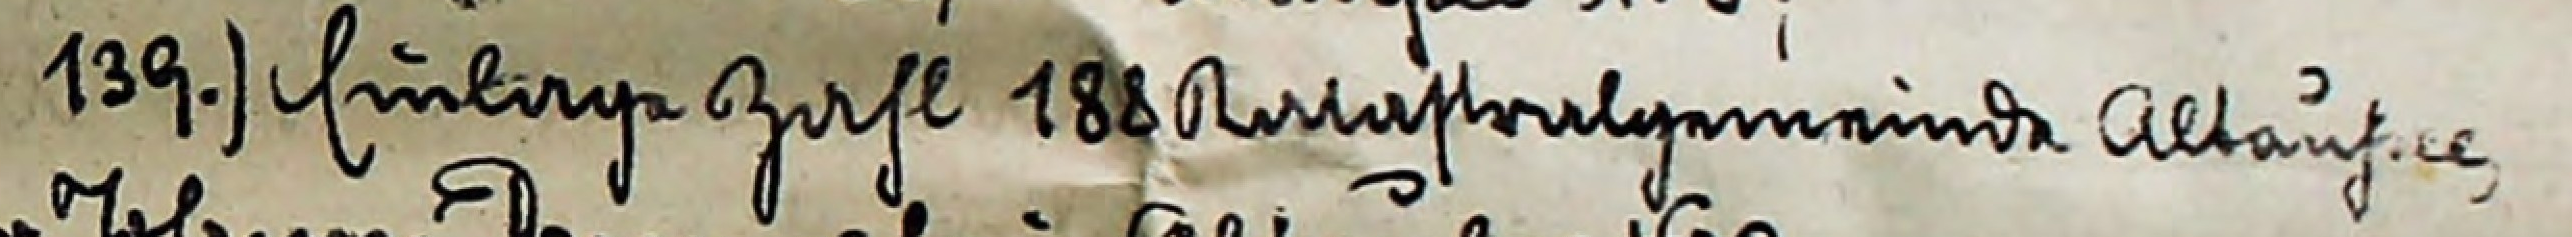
139.) Einlage Zahl 188 Katastralgemeinde Altaussee,
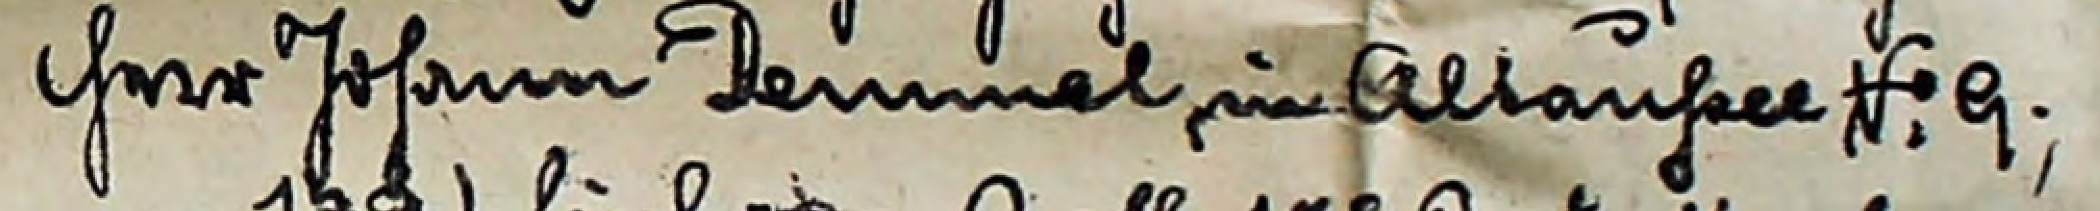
Herr Johann Demmel, in Altaussee № 9;
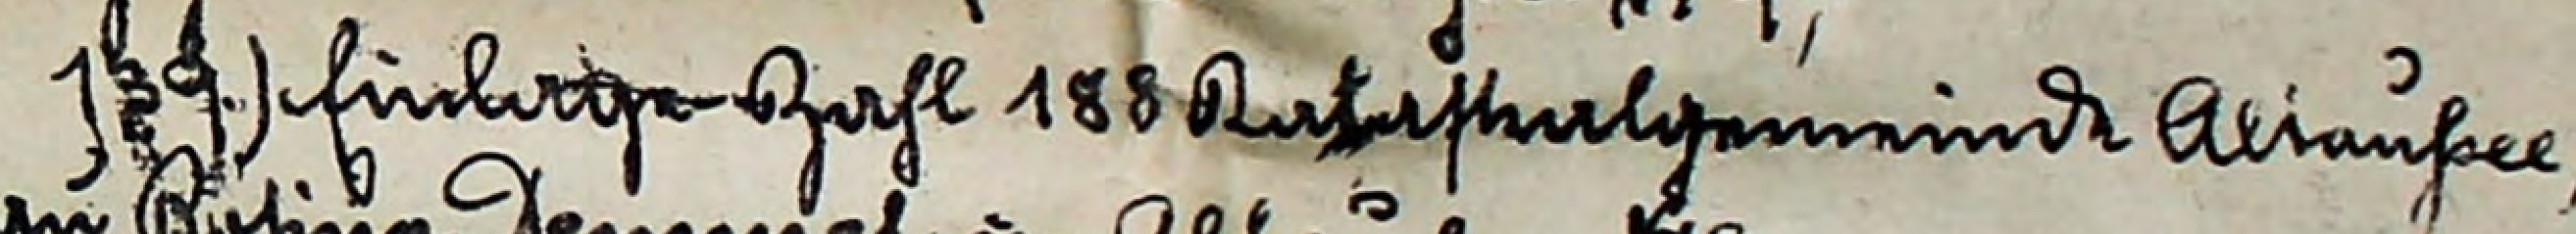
139.) Einlage - Zahl 188 Katastralgemeinde Altaussee,
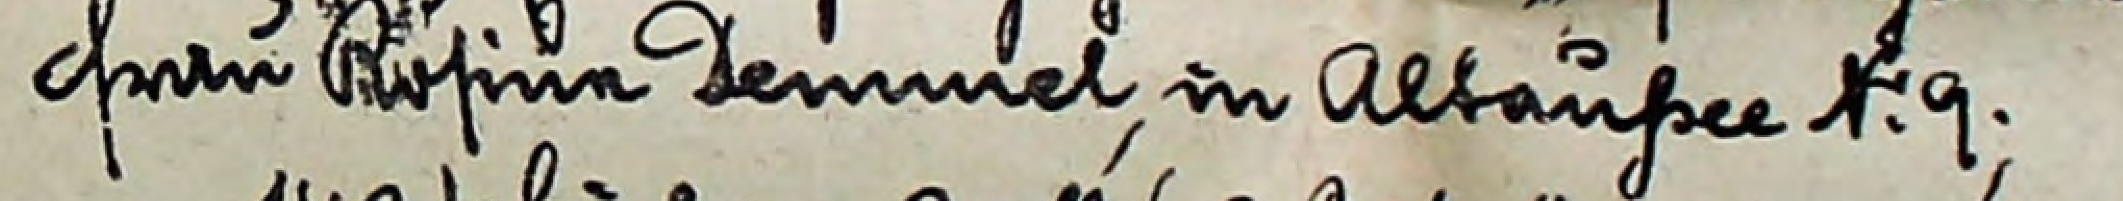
Frau Rosine Demmel, in Altaussee № 9;
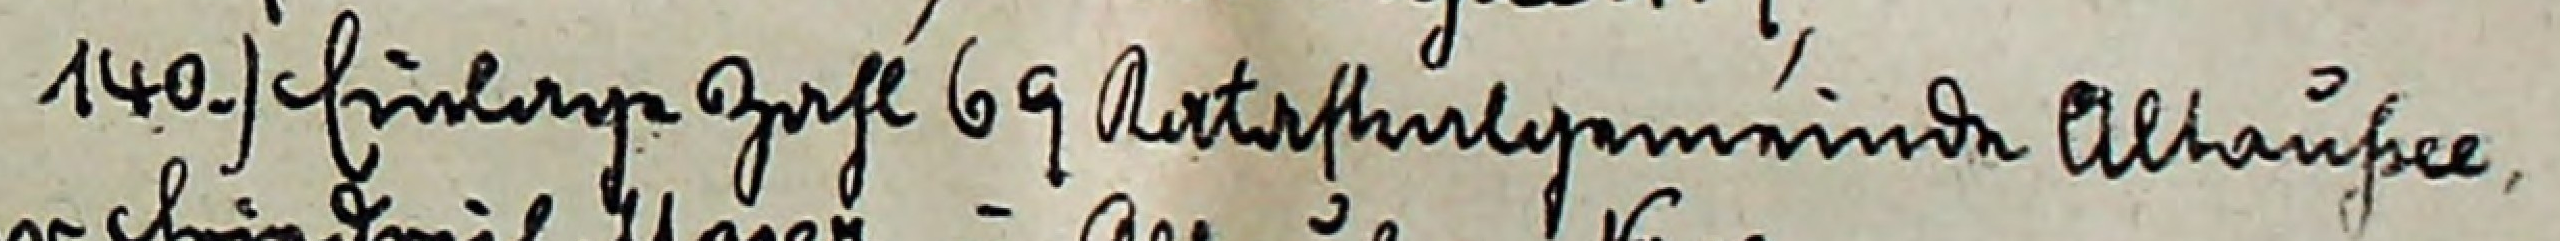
140.) Einlage Zahl 69 Katastralgemeinde Altaussee,
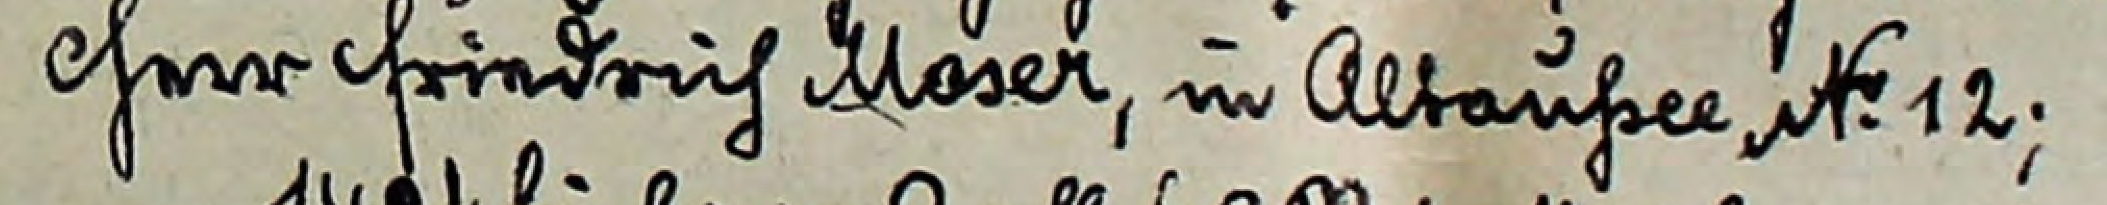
Herr Friedrich Moser, in Altaussee № 12;
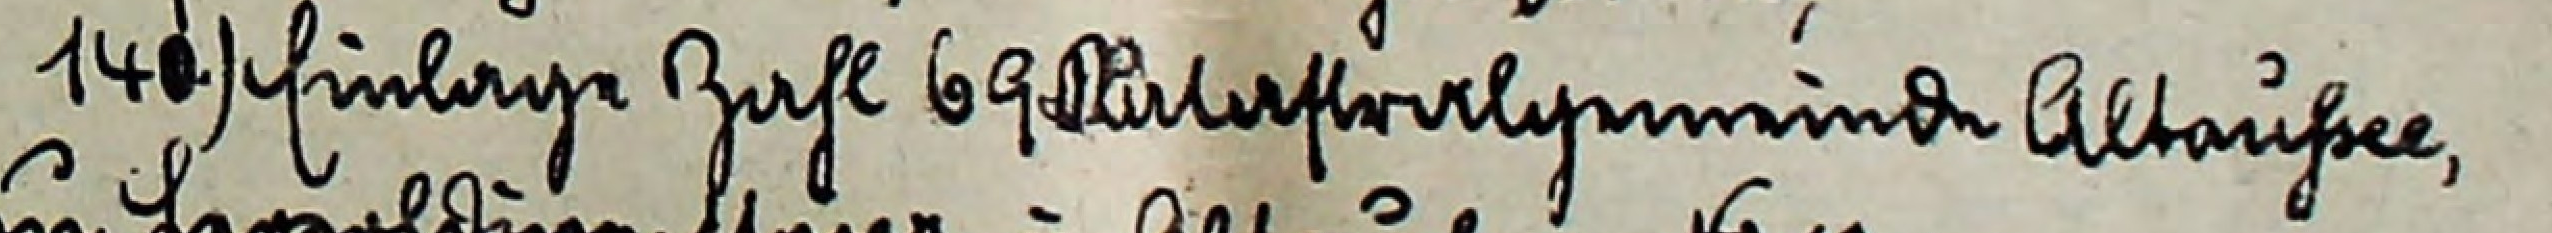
140.) Einlage Zahl 69 Katastralgemeinde Altaussee,
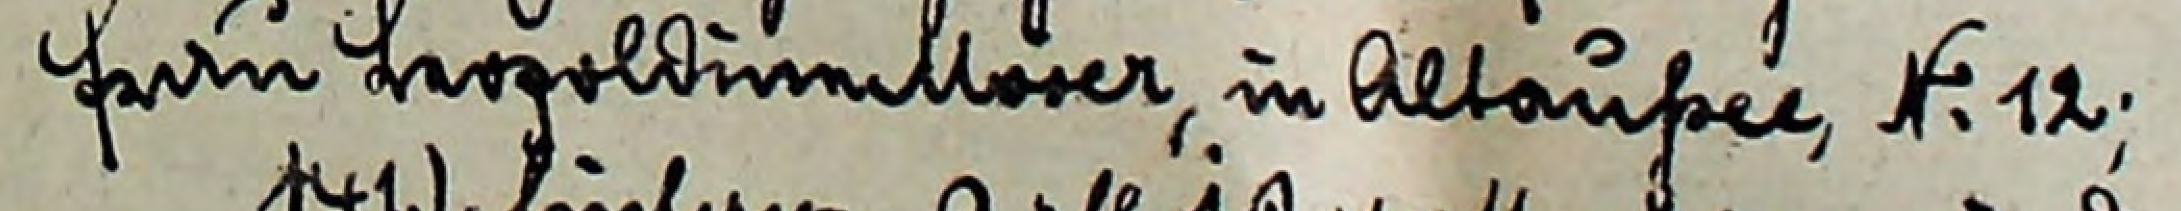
Frau Leopoldine Moser, in Altaussee, № 12;
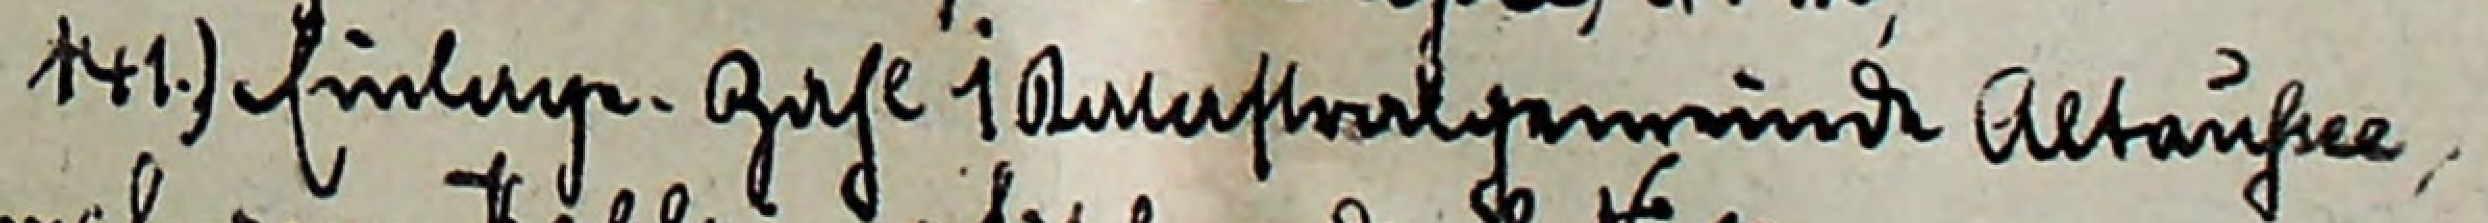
141.) Einlage - Zahl 1 Katastralgemeinde Altaussee,
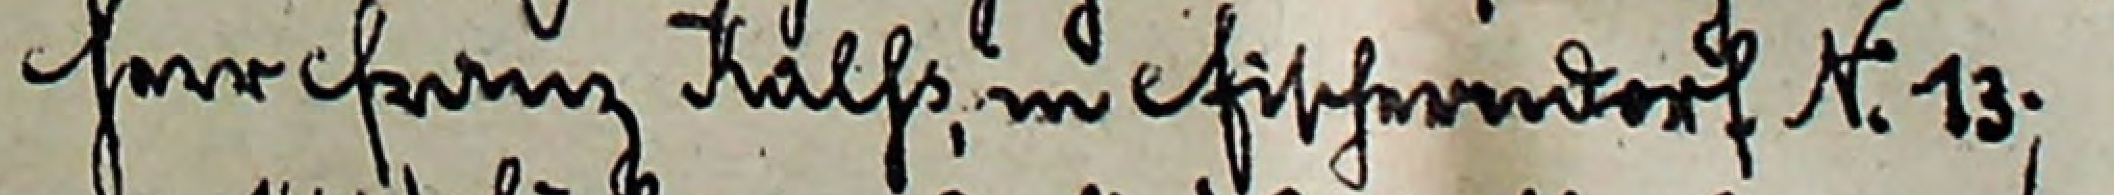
Herr Franz Kalhs, in Fischerndorf № 13;
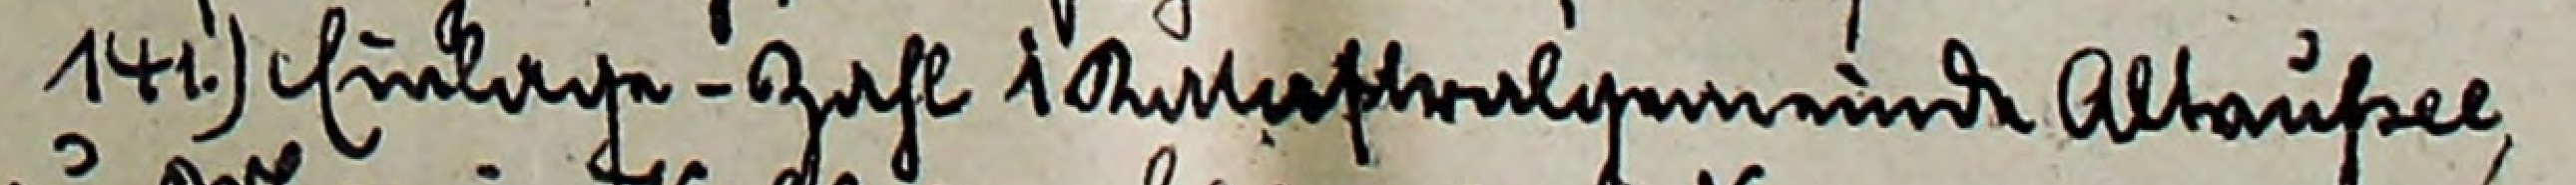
141.) Einlage - Zahl 1 Katastralgemeinde Altaussee,
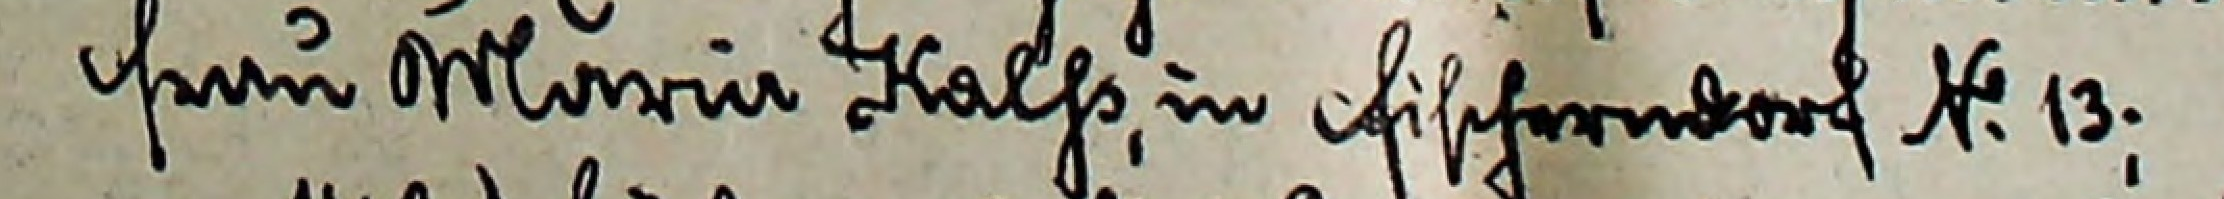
Frau Maria Kalhs, in Fischerndorf № 13;
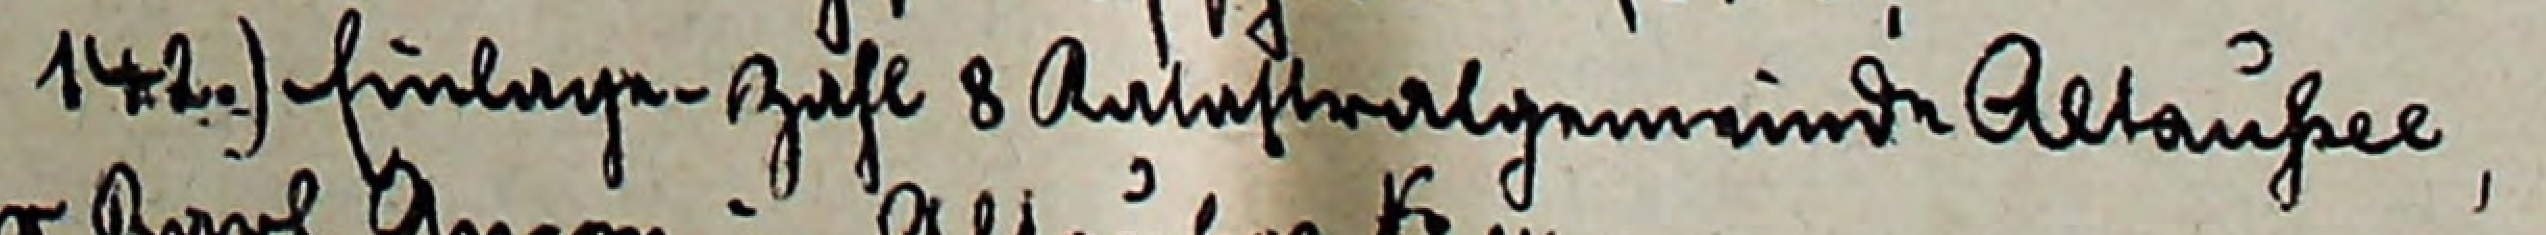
142.) Einlage - Zahl 8 Katastralgemeinde Altaussee,
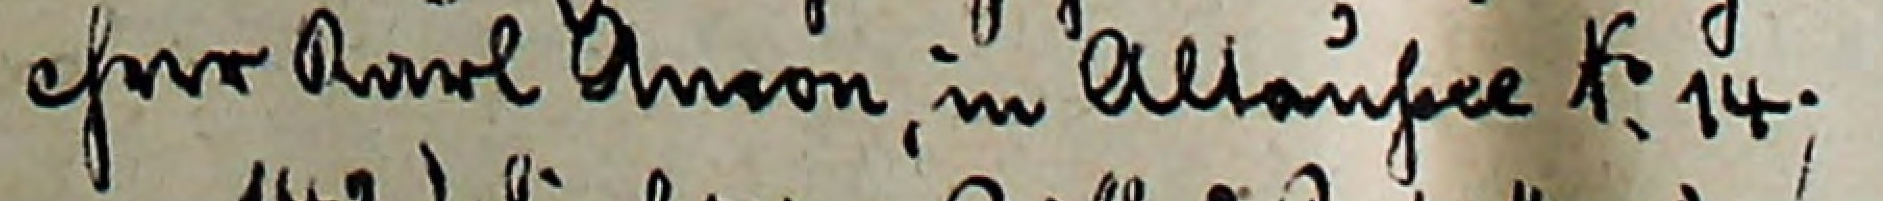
Herr Karl Amon, in Altaussee № 14;
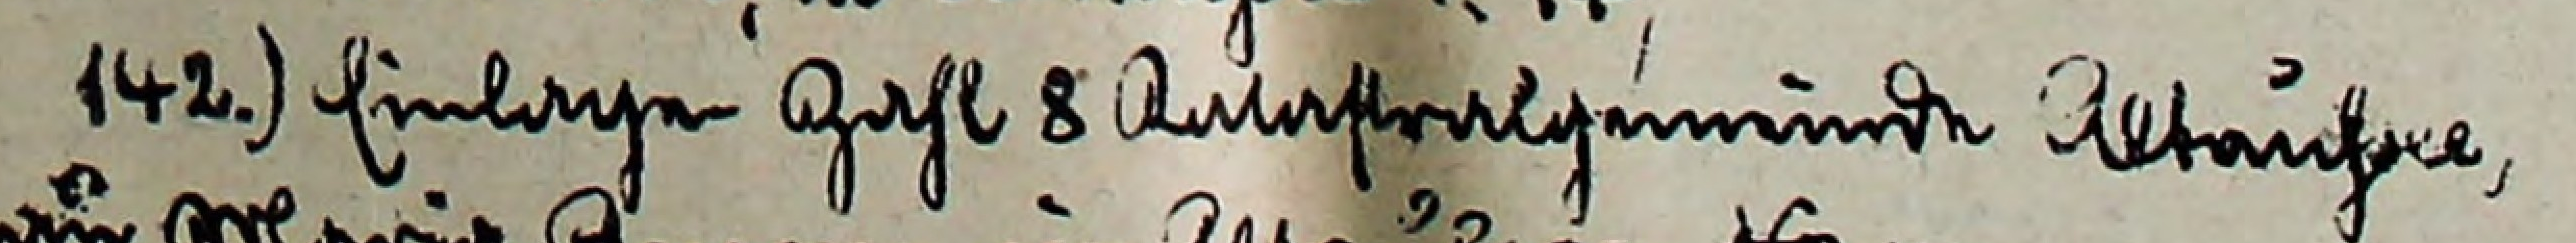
142.) Einlage - Zahl 8 Katastralgemeinde Altaussee,
